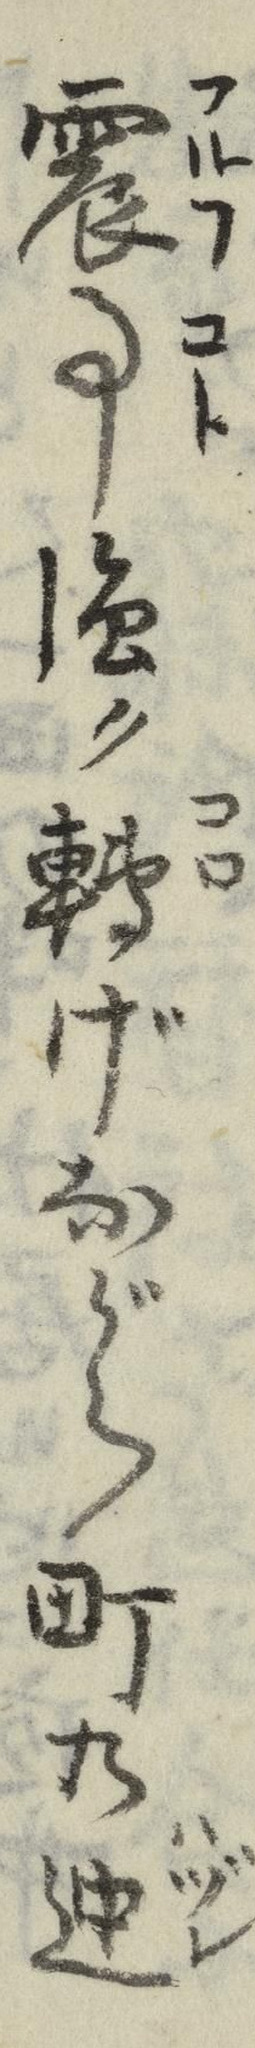震事強ク転げながら町乃迚
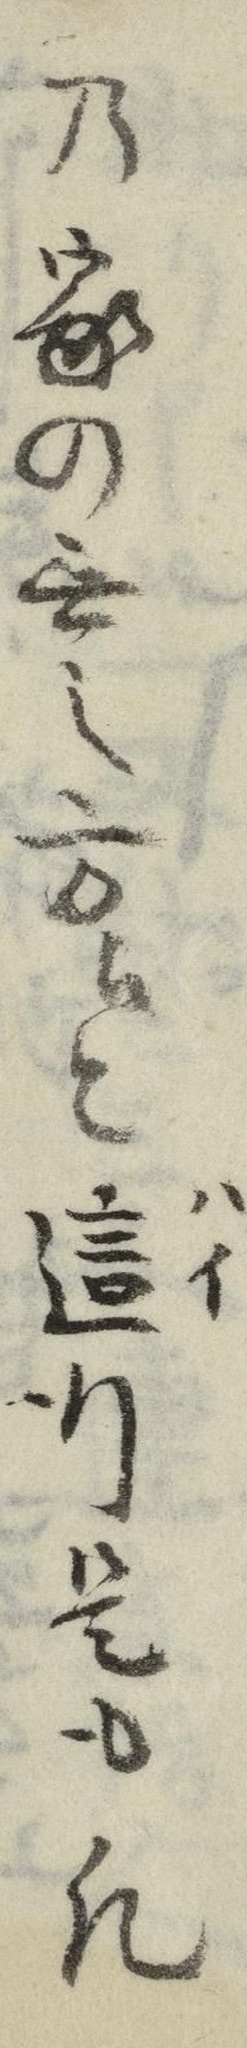乃家の無之方えと這行是も凡
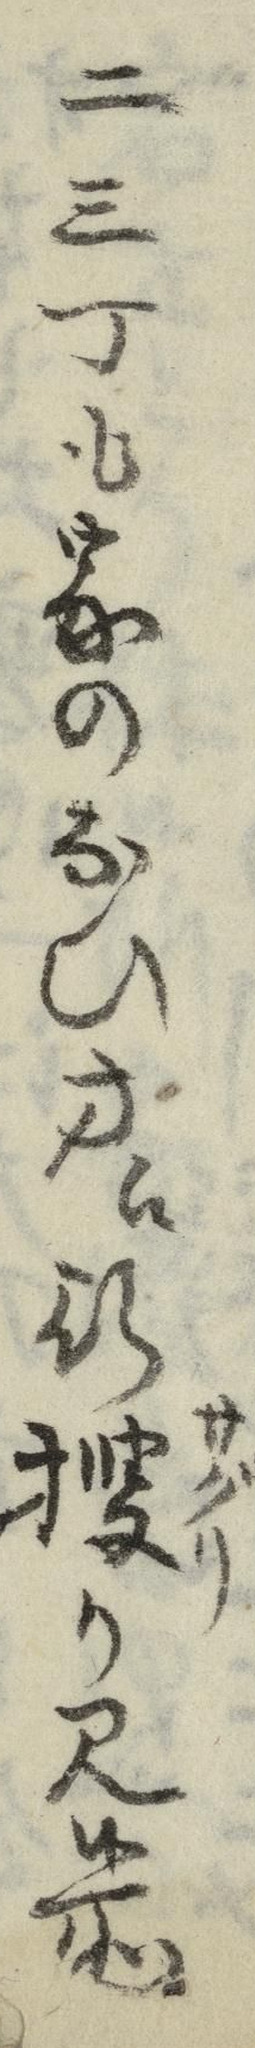二三丁も家のなひ方え行搜り見候所
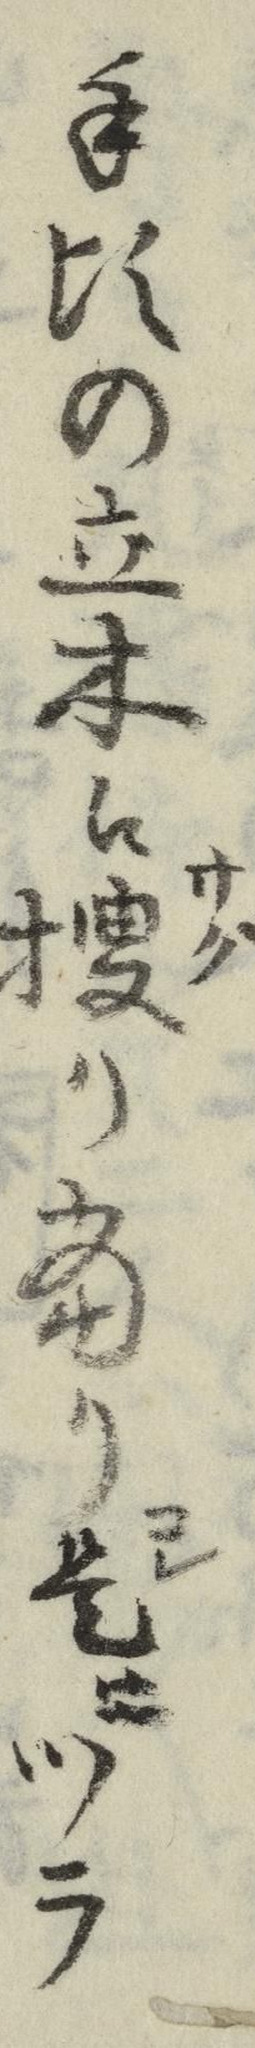手頃の立木え搜り当り是二ツラ
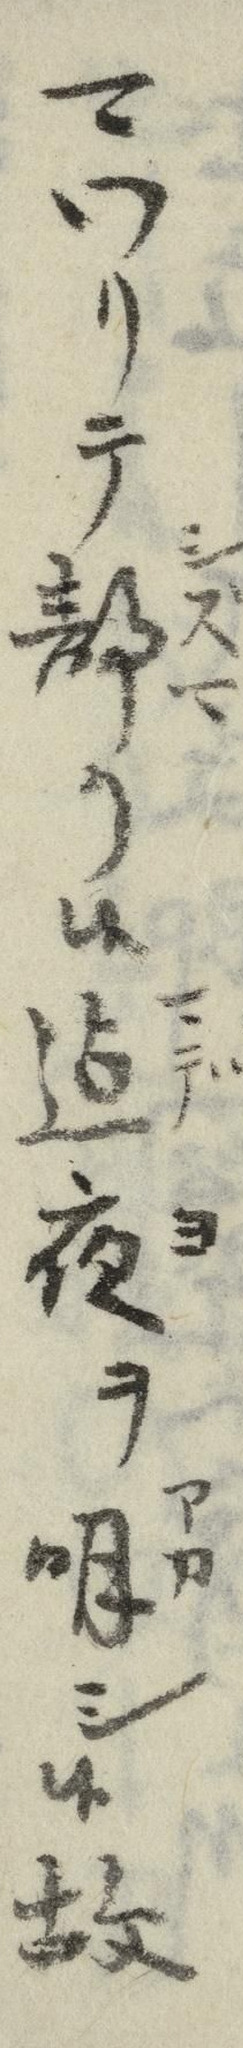マワリテ静り候迄夜ヲ明シ候故
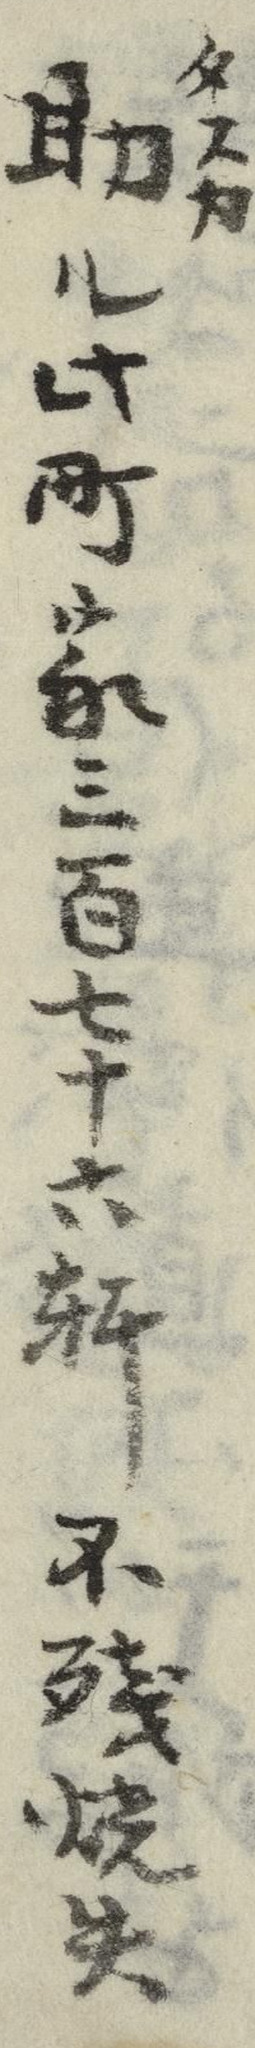助ル此町家三百七十六軒不残焼失
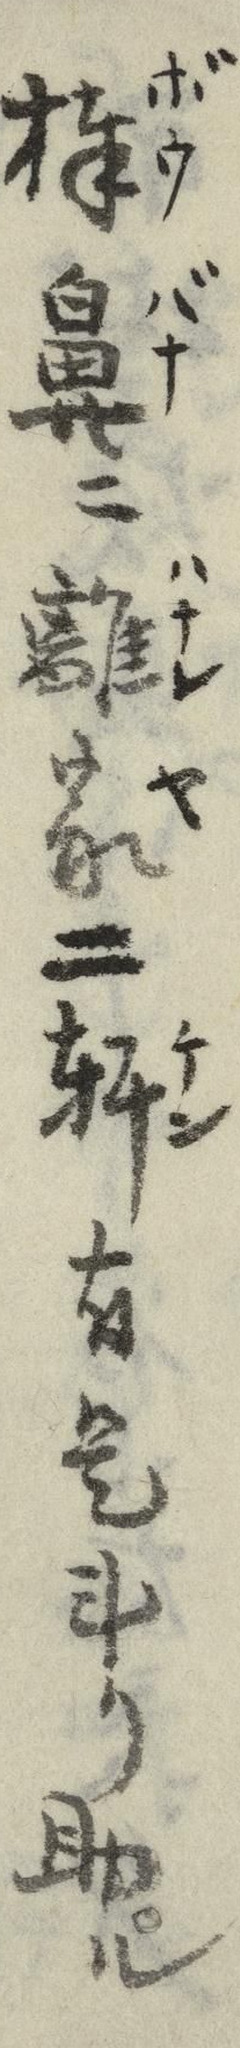棒鼻二離家二軒有是計り助ル
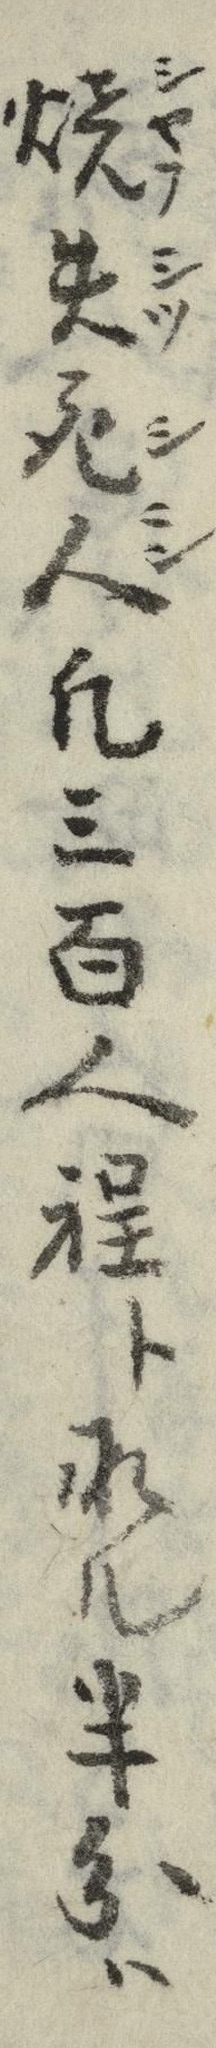焼失死人凡三百人程ト承ㇽ半分ハ

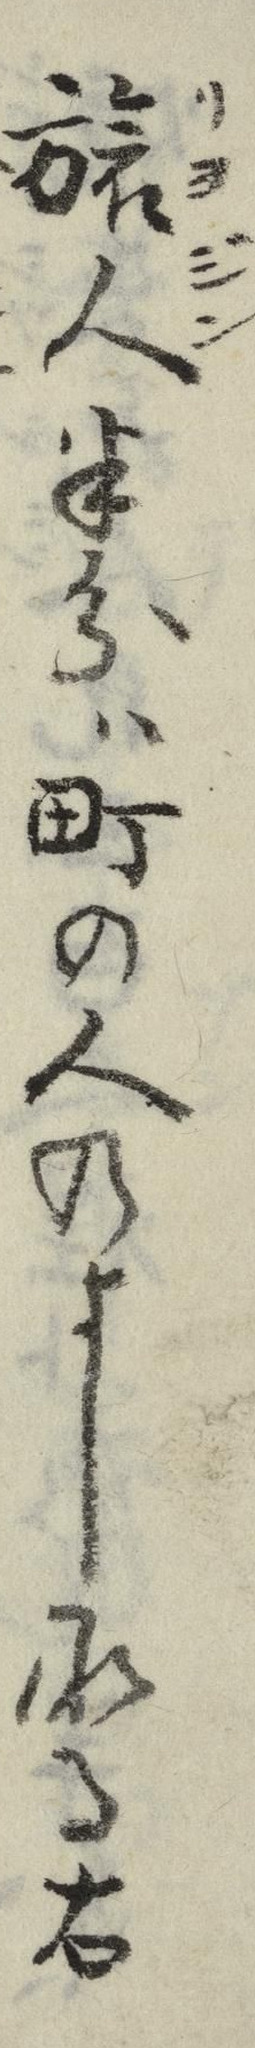旅人半分ハ町の人乃よし承る右
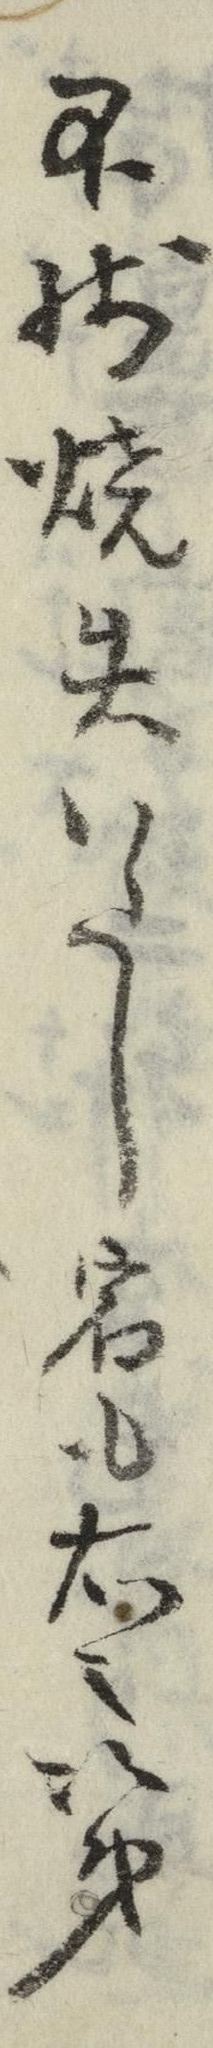不残焼失いたし宿も右之次第
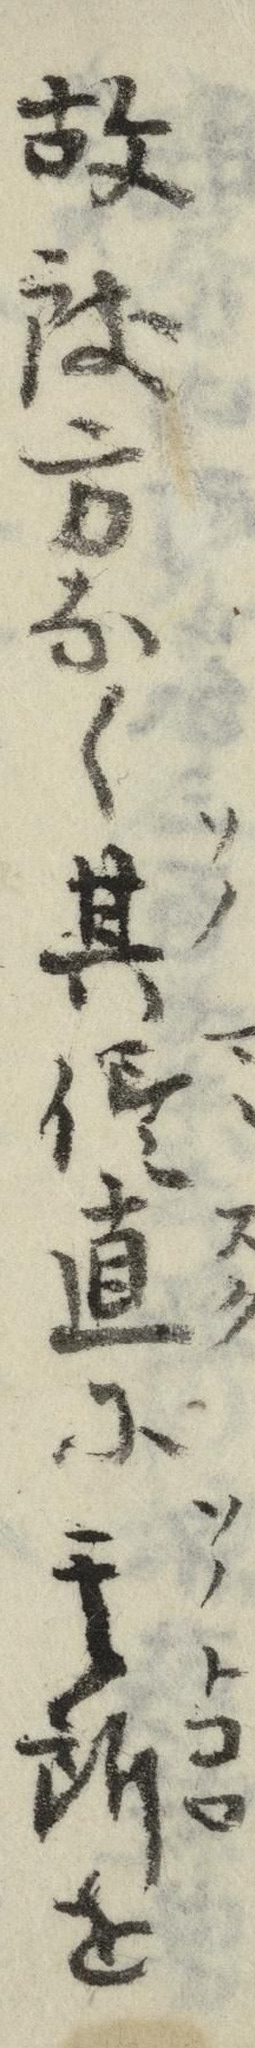故致方なく其侭直に其所を
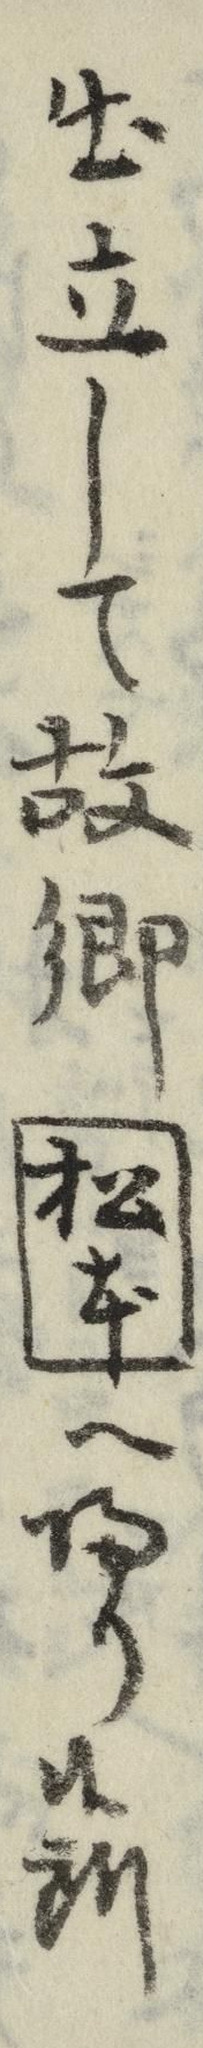出立して故郷松本へ帰り候所
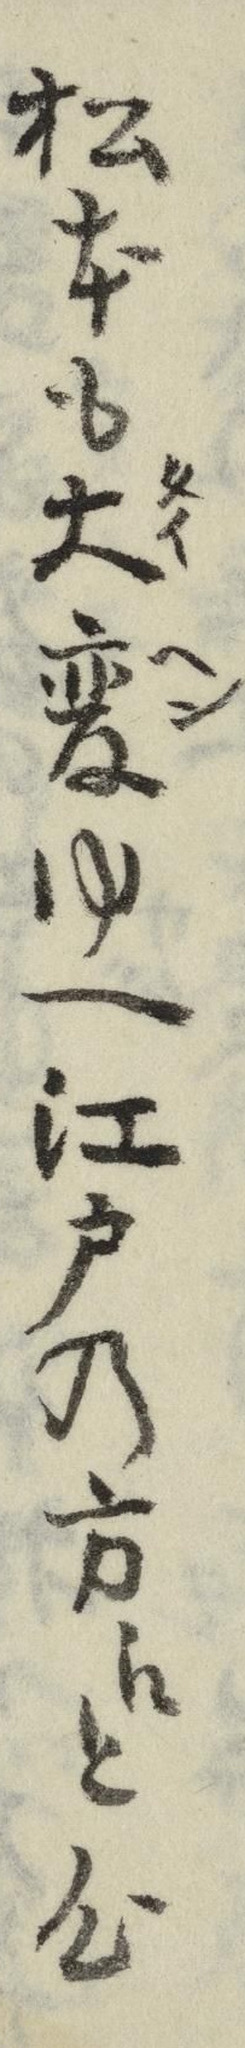松本も大変ゆへ江戸乃方えと心
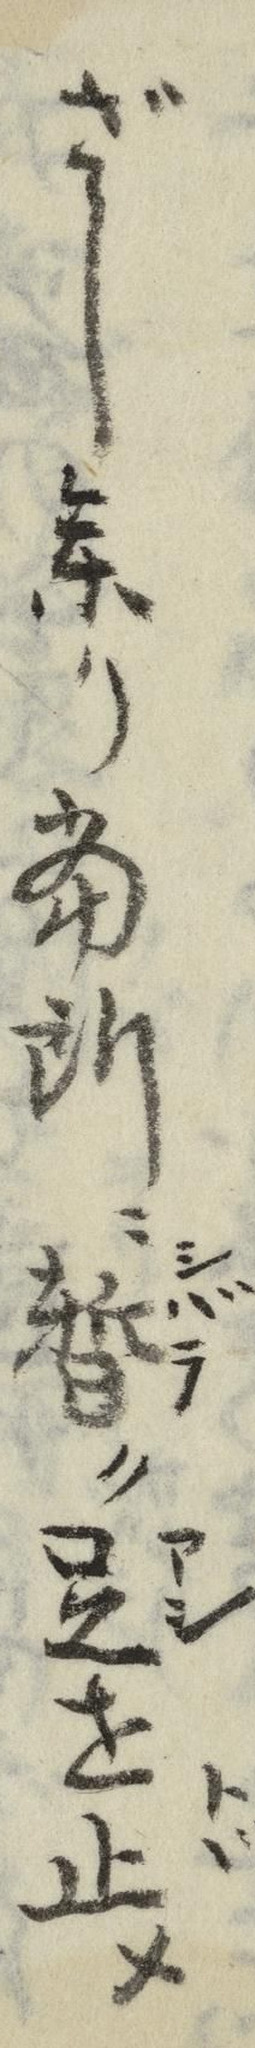ざし参り当所二暫ク足を止メ
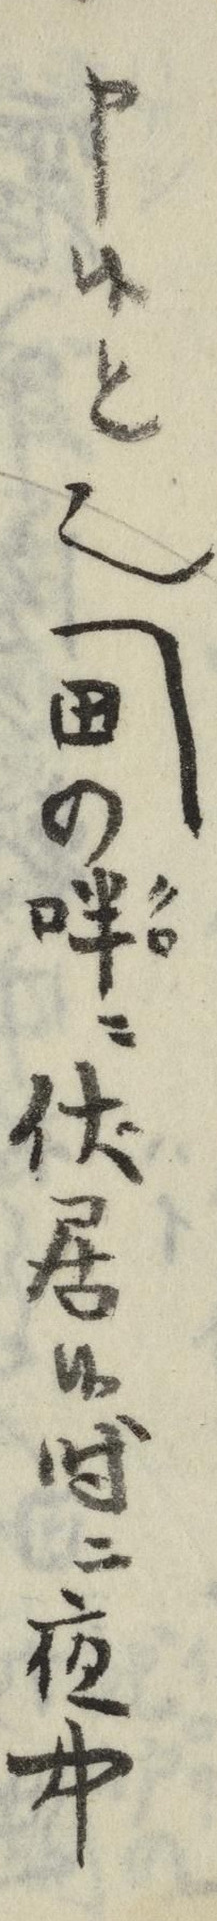申候と也田の畔二伏居候時二夜中
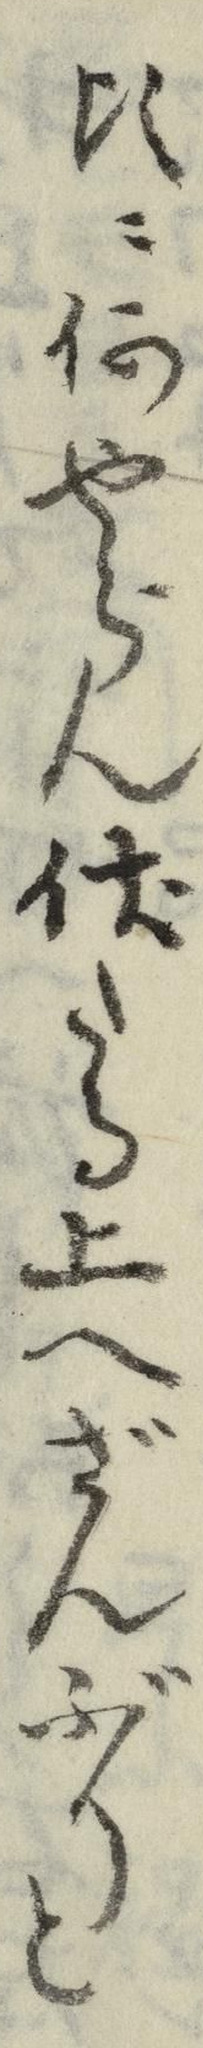頃二何やらん伏たる上へざんぶりと
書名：信州大地震一件之冩　丁未弘化四年三月吉日
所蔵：東京大学地震研究所図書室 Earthquake Research Institute Library, The University of Tokyo, JAPAN
